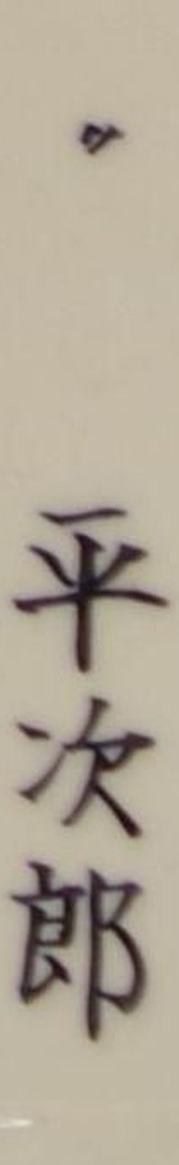平次郎
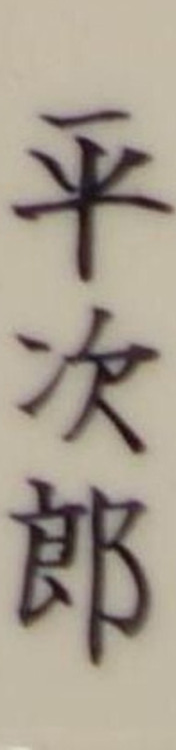平次郎
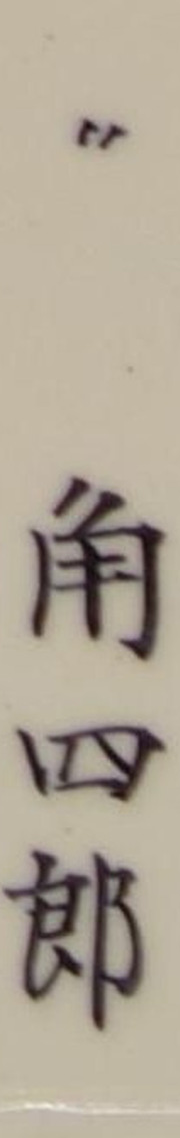角四郎
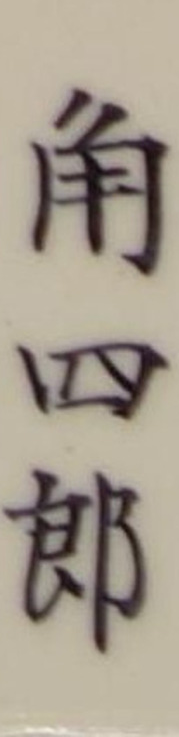角四郎
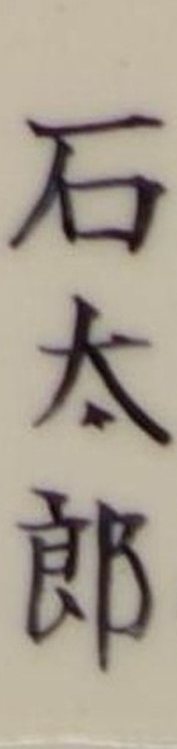石太郎
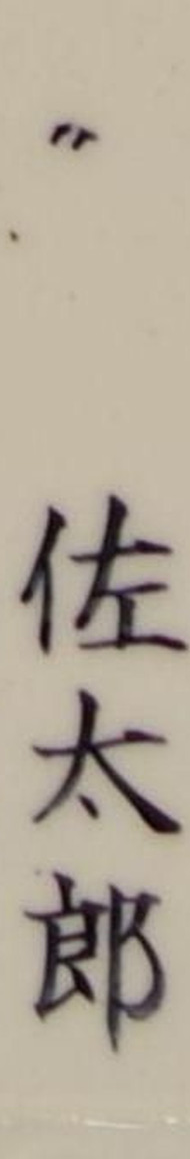佐太郎
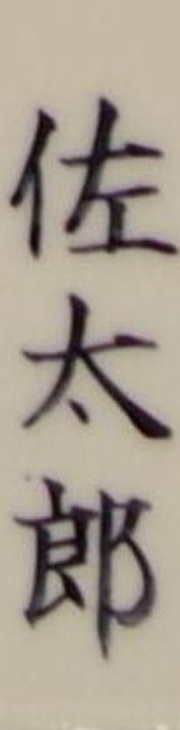佐太郎
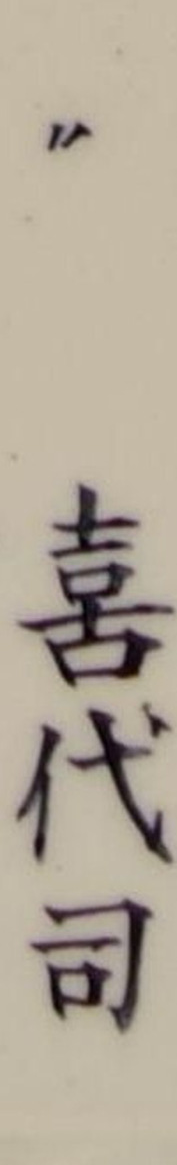喜代司
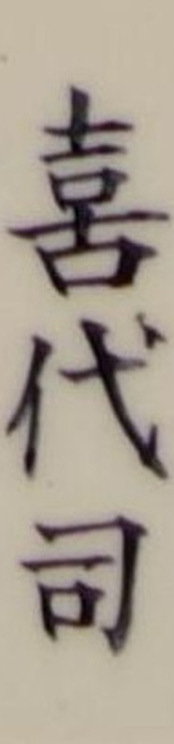喜代司
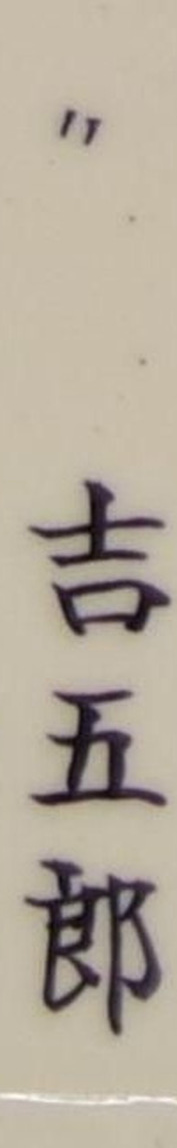吉五郎
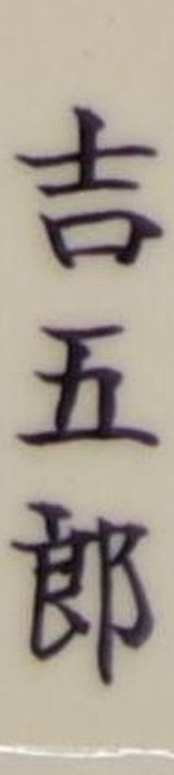吉五郎
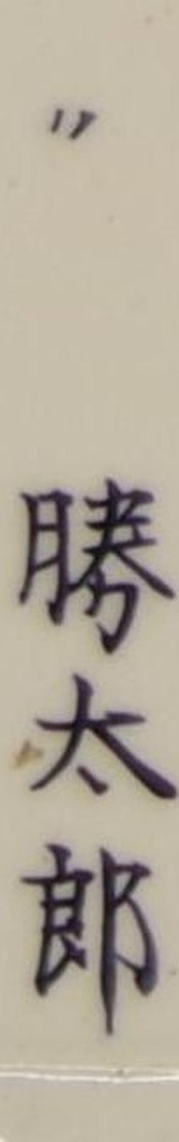勝太郎
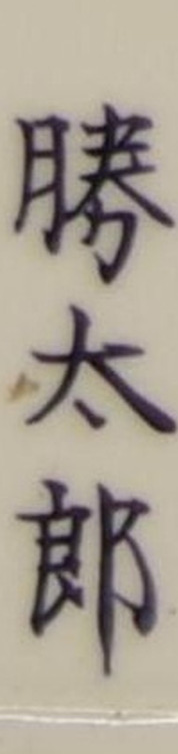勝太郎

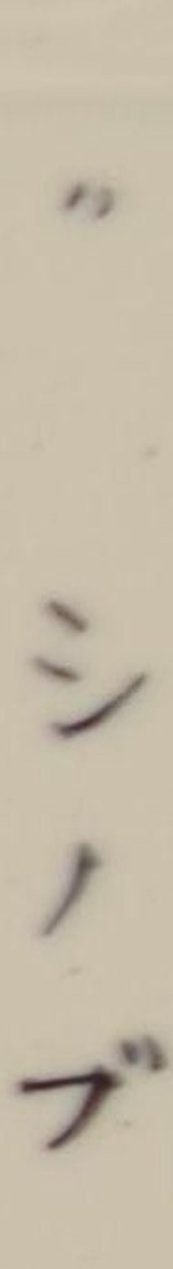シノブ
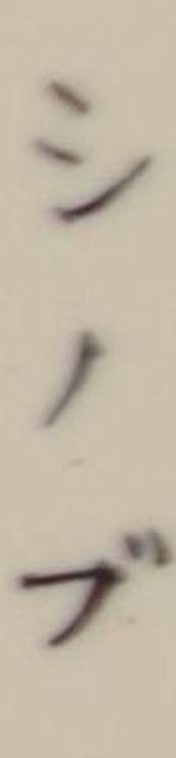シノブ
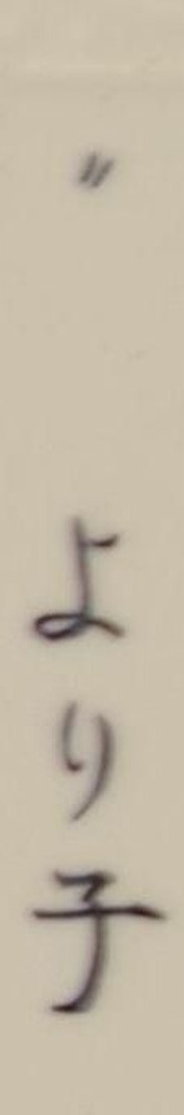より子
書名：M~S
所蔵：高野山金剛峯寺
